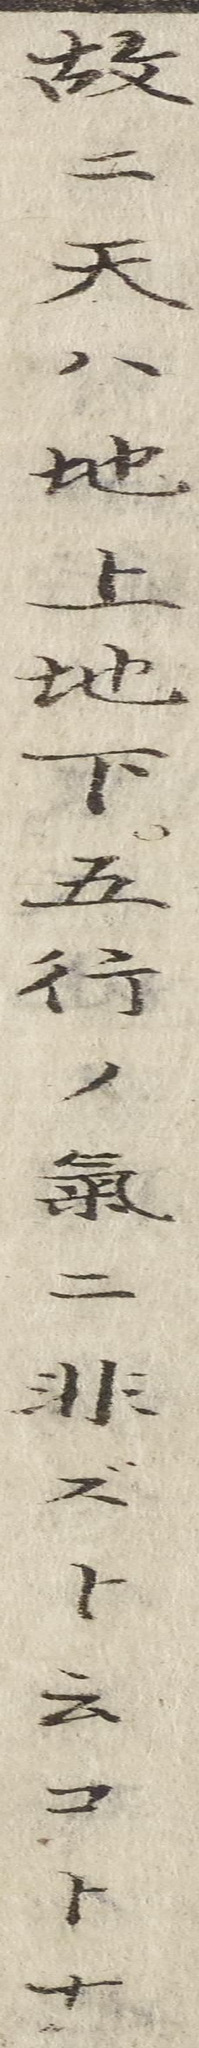故ニ天ハ地上地下。五行ノ気ニ非ズト云コトナ
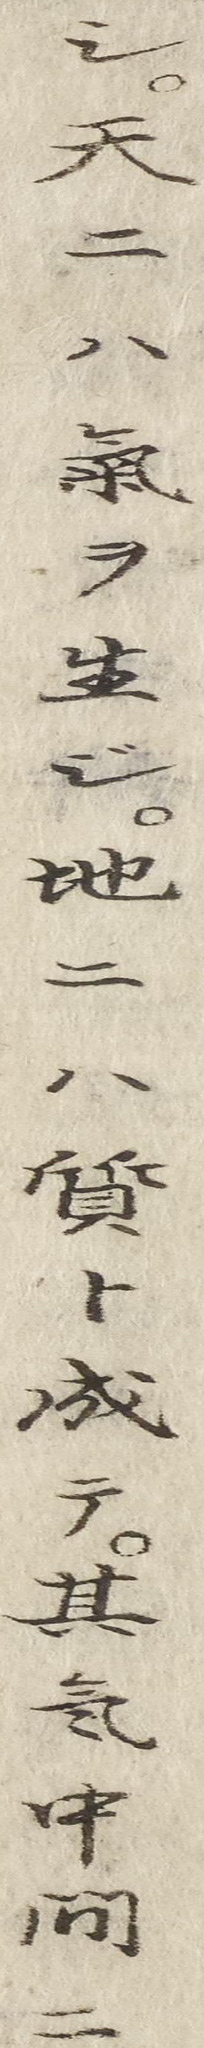シ。天ニハ気ヲ生ジ。地ニハ質ト成テ。其気中間ニ
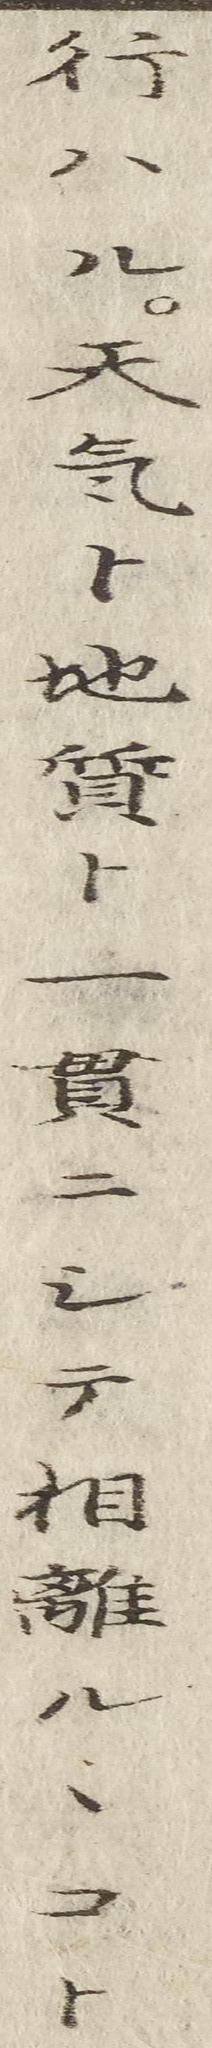行ハル。天気ト地質ト一貫ニシテ相離ルヽコト
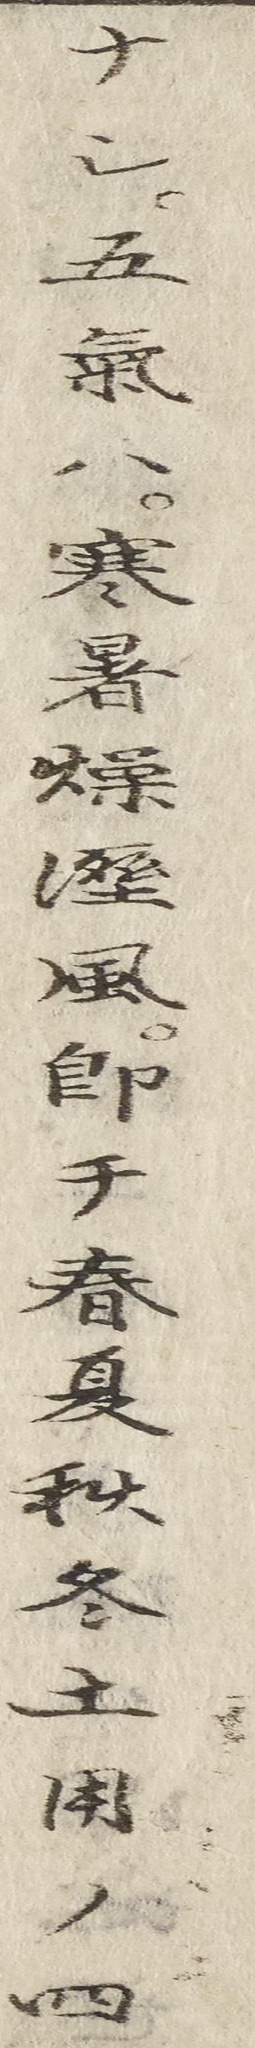ナシ。五気ハ。寒暑燥湿風。即チ春夏秋冬土用ノ四
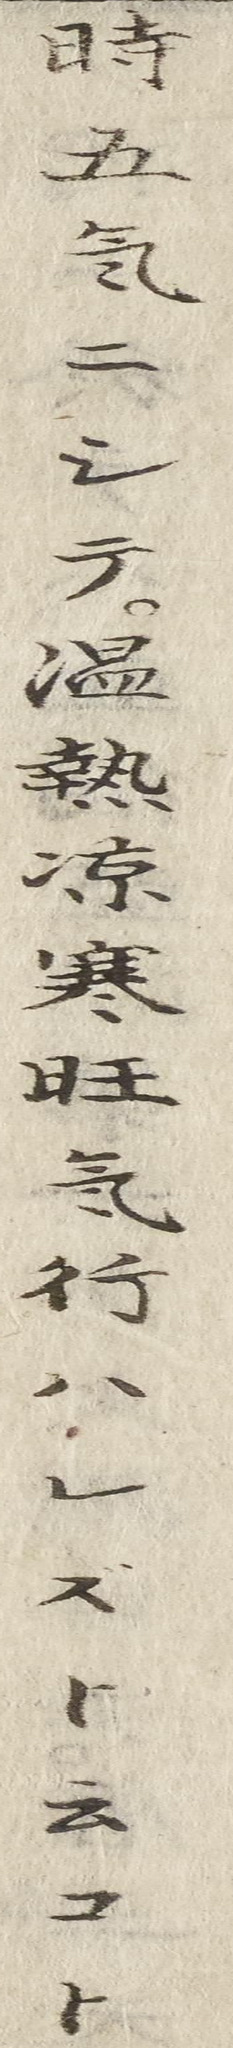時五気ニシテ。温熱凉寒旺気行ハレスト云コト
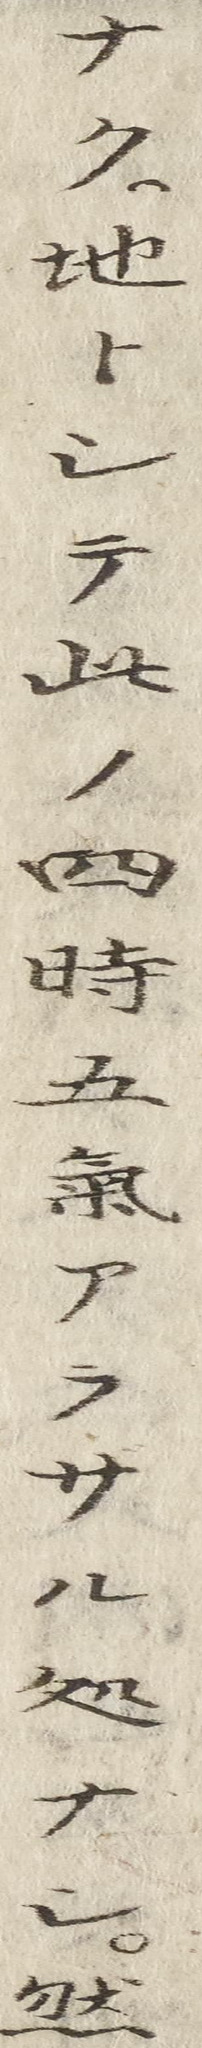ナク。地トシテ此ノ四時五気アラサル処ナシ。然
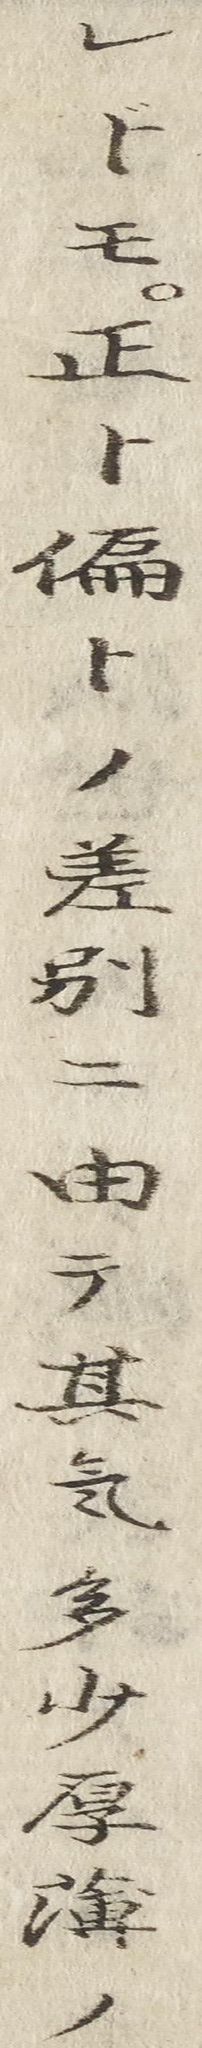レドモ。正ト偏トノ差別ニ由テ其気多少厚薄ノ
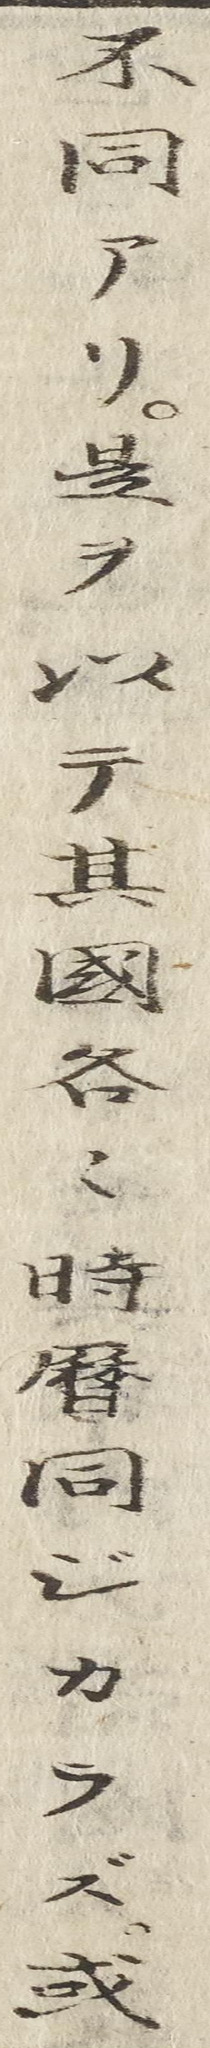不同アリ。是ヲ以テ其国各々時暦同ジカラズ。或
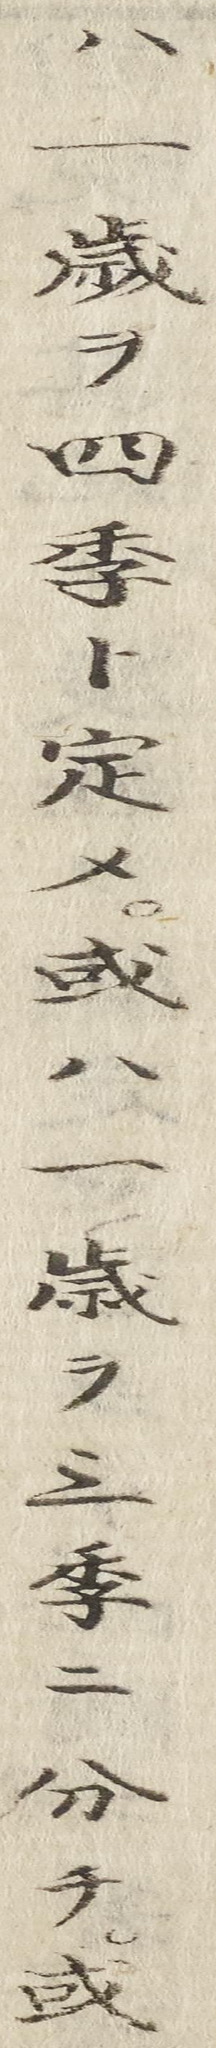ハ一歳ヲ四季ト定メ。或ハ一歳ヲ三季ニ分チ。或
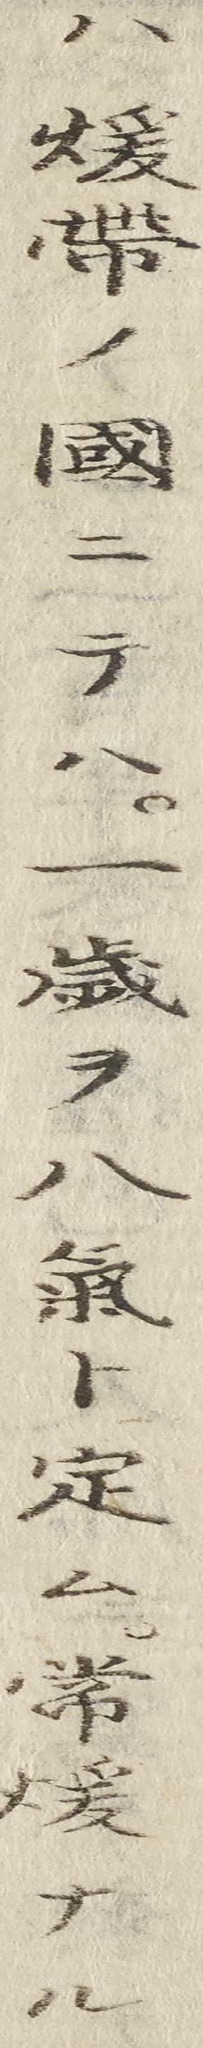ハ煖帯ノ国ニテハ。一歳ヲ八気ト定ム。常煖ナル
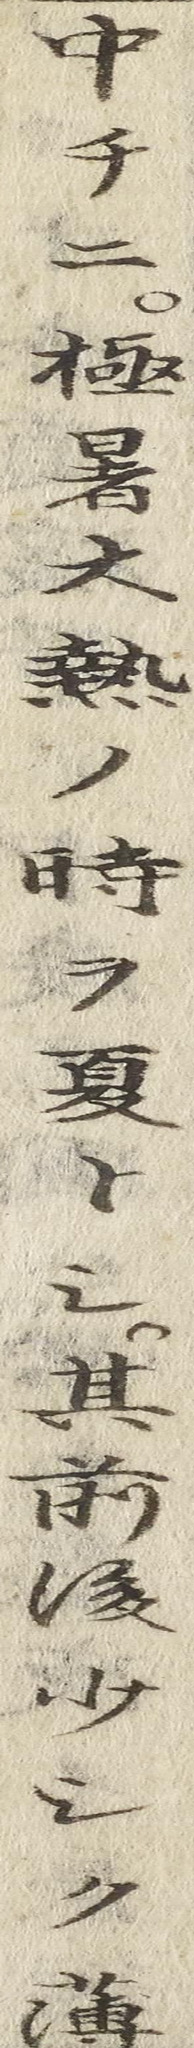中チニ。極暑大熱ノ時ヲ夏トシ。其前後少シク薄
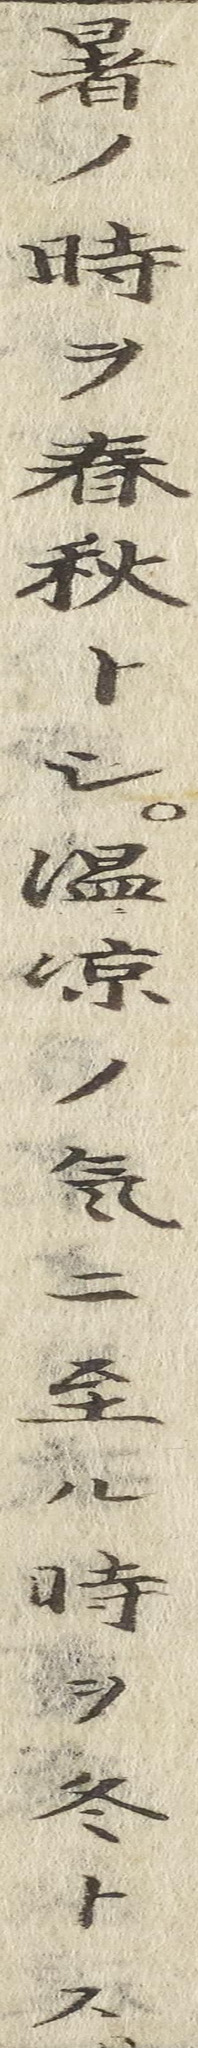暑ノ時ヲ春秋トシ。温凉ノ気ニ至ル時ヲ冬トス。
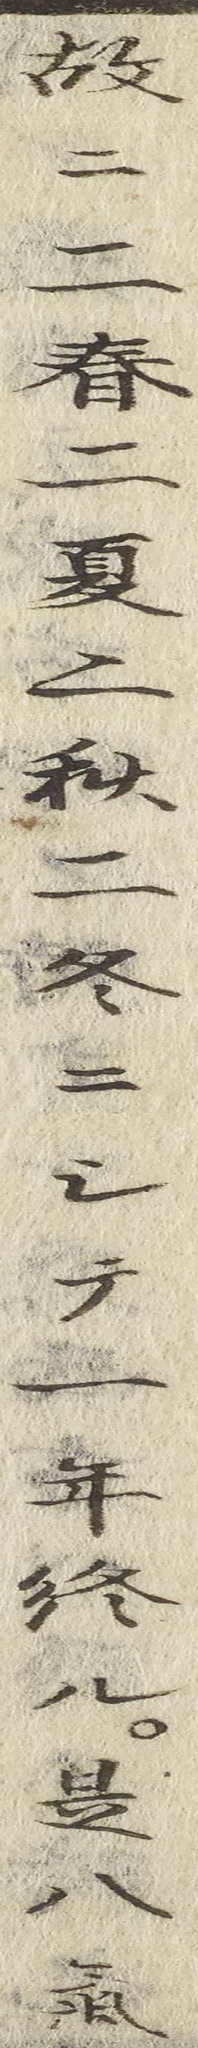故ニ二春二夏二秋二冬ニシテ一年終ル。是八気
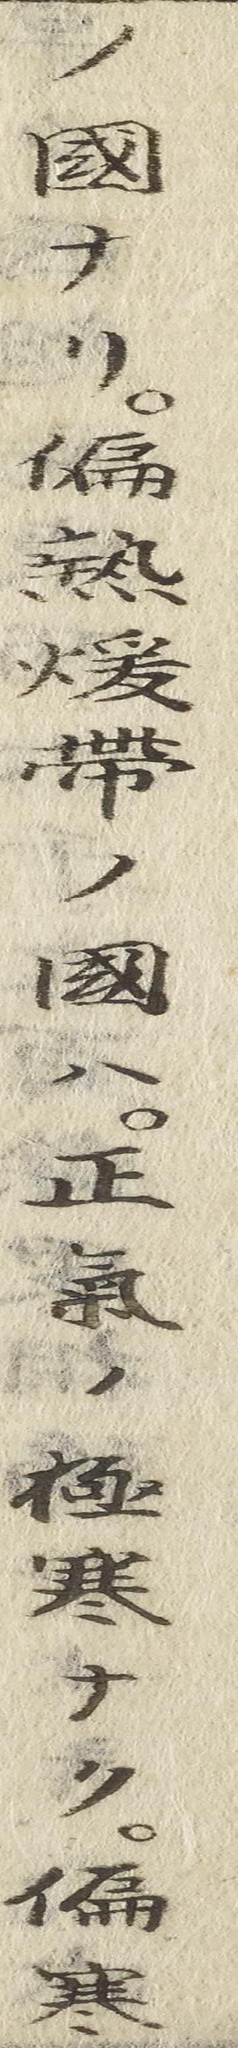ノ国ナリ。偏熱煖帯ノ国ハ。正気ノ極寒ナク。偏寒
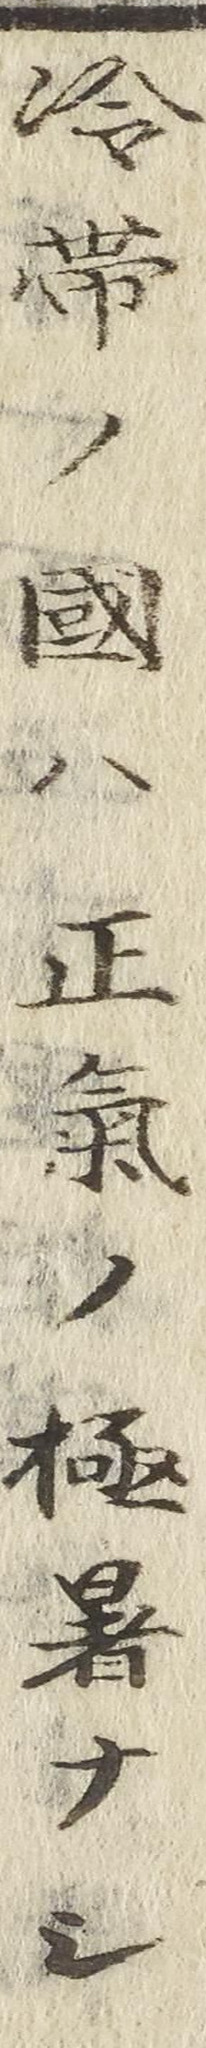冷帯ノ国ハ正気ノ極暑ナシ
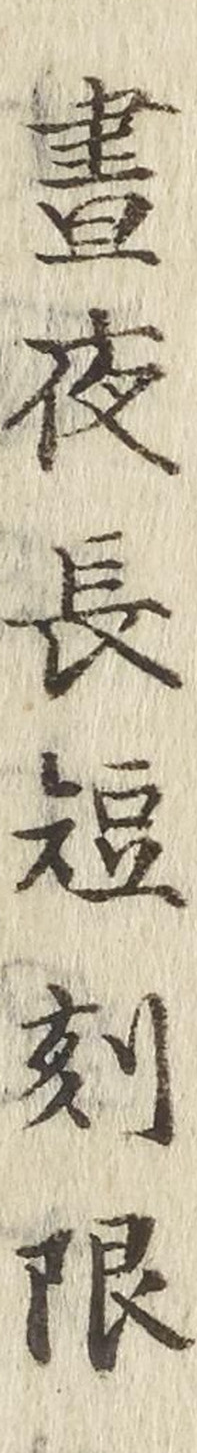昼夜長短刻限
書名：大略天学名目鈔　天經或問附録
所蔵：東京大学地震研究所図書室 Earthquake Research Institute Library, The University of Tokyo, JAPAN
